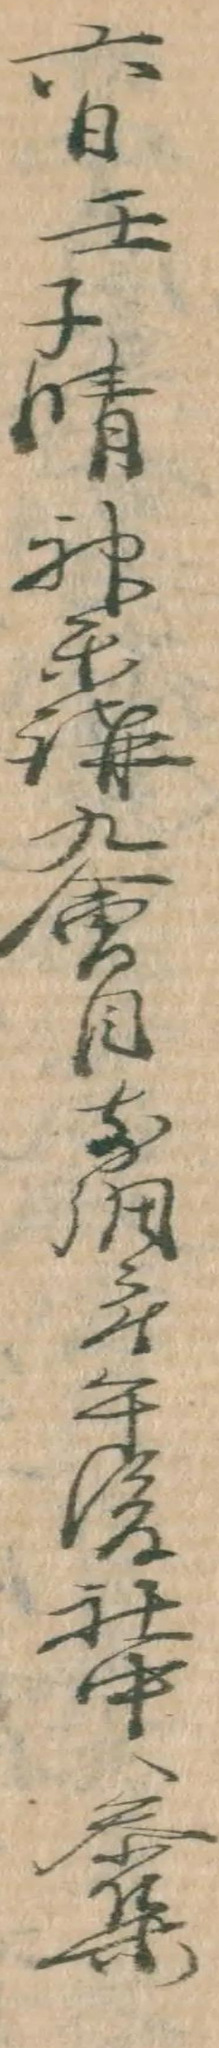六日壬子晴神楽講九會目前調ニ付午後社中へ参集
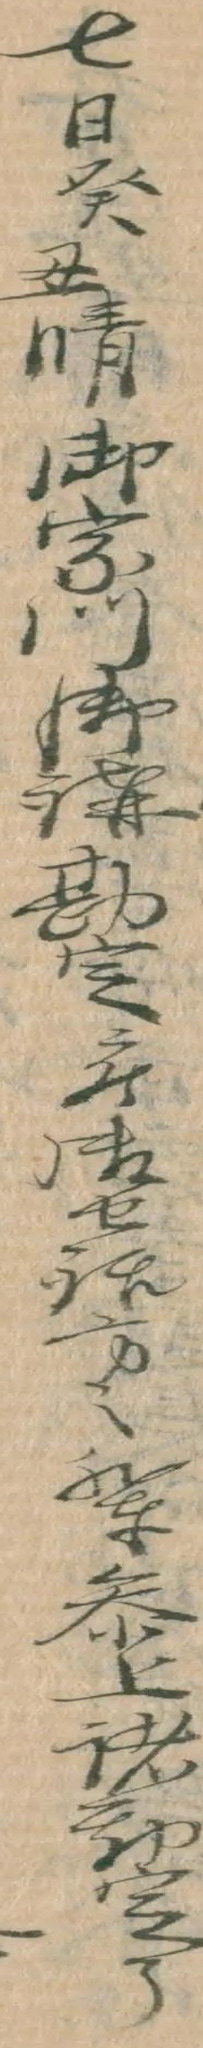七日癸丑晴御家門御講勘定ニ付御セ詰方之参上諸勧定了
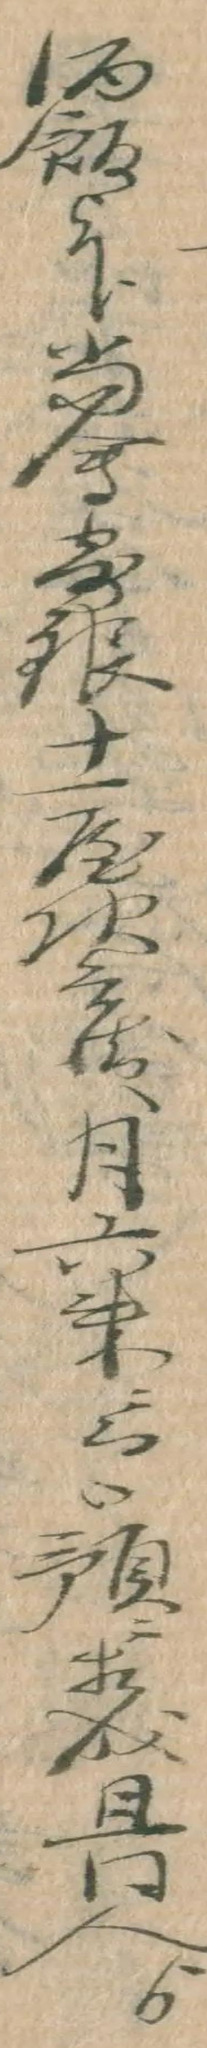酒飯被下當会寄銀十一屋次兵衛へ月六朱ニ而御預に相成且同人ゟ
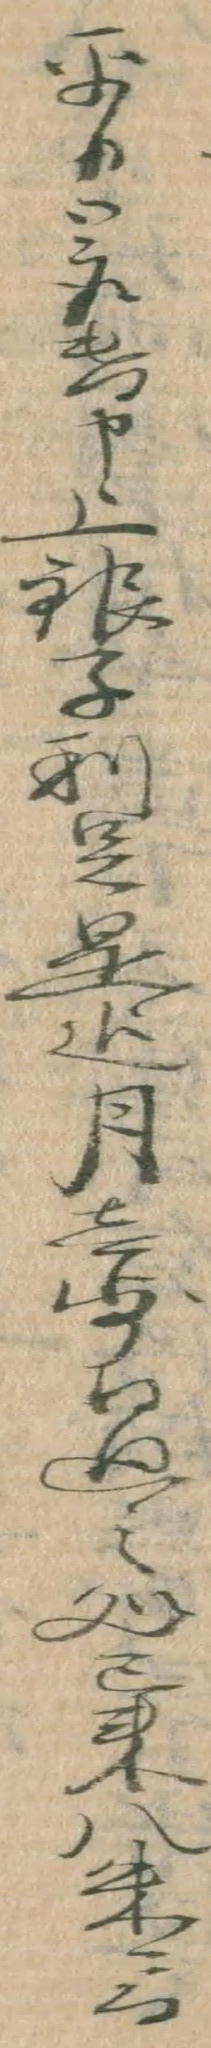平日御取替申上銀子利足是迄月壱歩日廻之処已来八朱ニ而
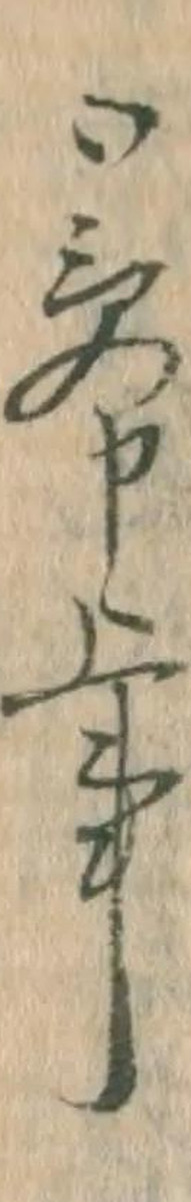御受申上事
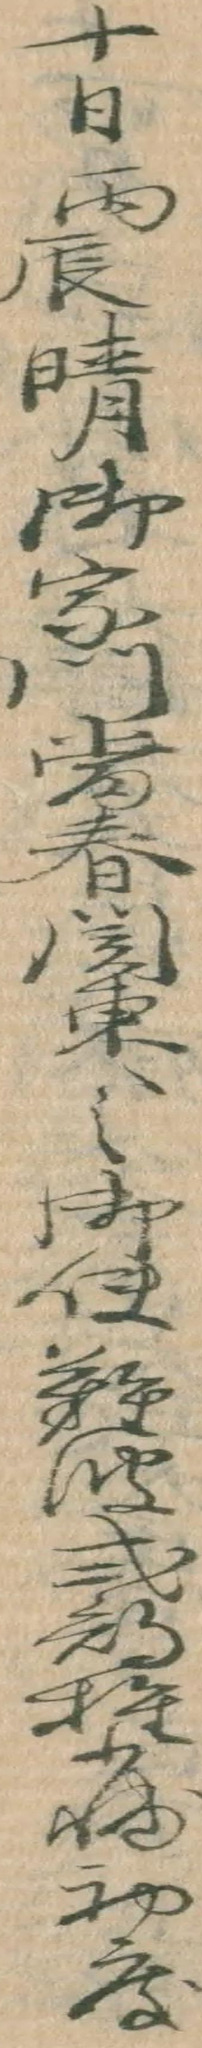十日丙辰晴御家門當春関東へ之御使難波式部権少輔初度
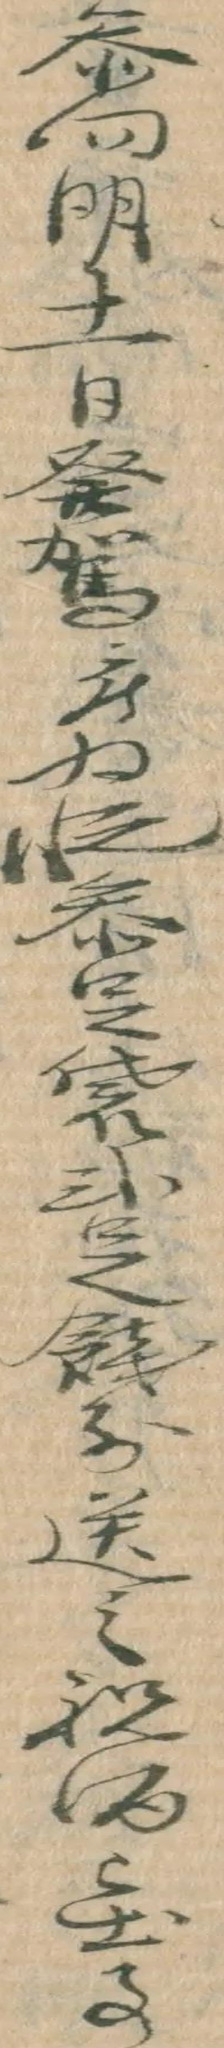参向明十一日発駕ニ付為祝参足袋弐足餞別送之祝酒被出事
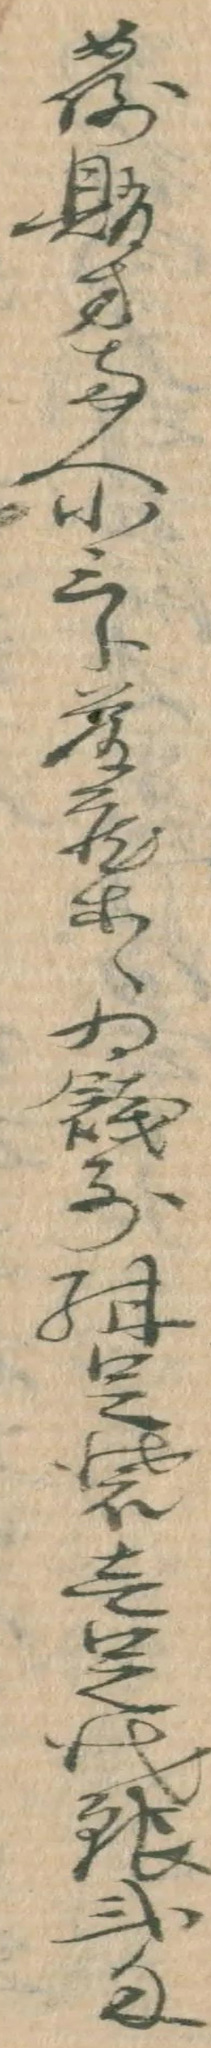如何賄方両人小三郎藤蔵等へ為餞別足袋壱足代銀弐匁
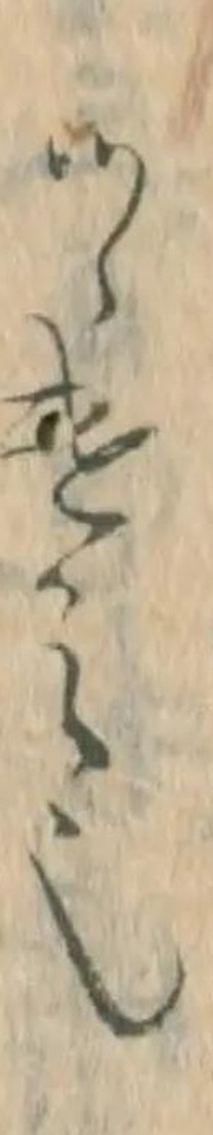ツヽ遣之也
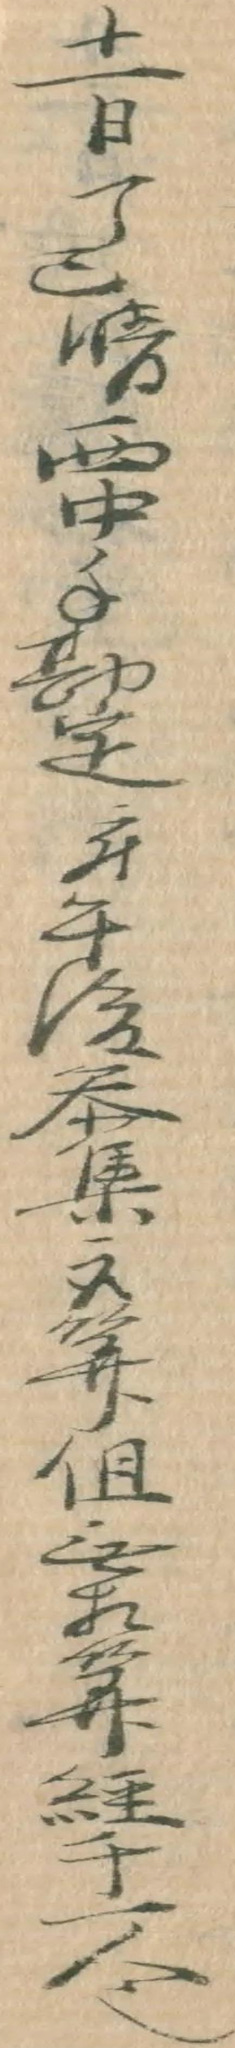十一日丁巳晴西中手勘定ニ付午後奔参集取算但無相算経千一人也

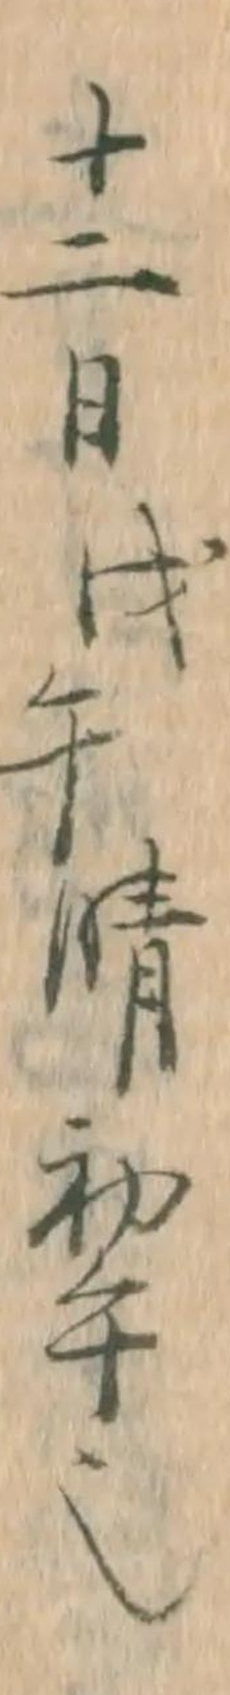十二日戊午晴初午也
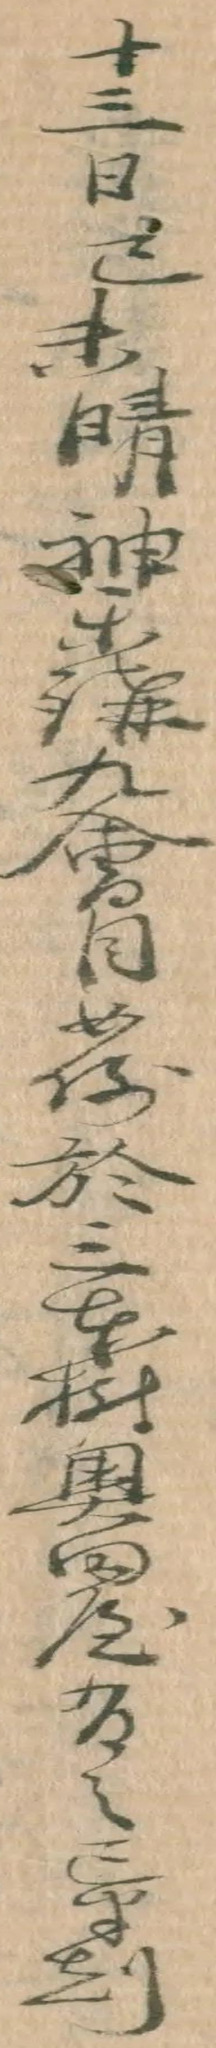十三日己未晴神楽講九會目如例於三本樹奥田屋有之巳半刻
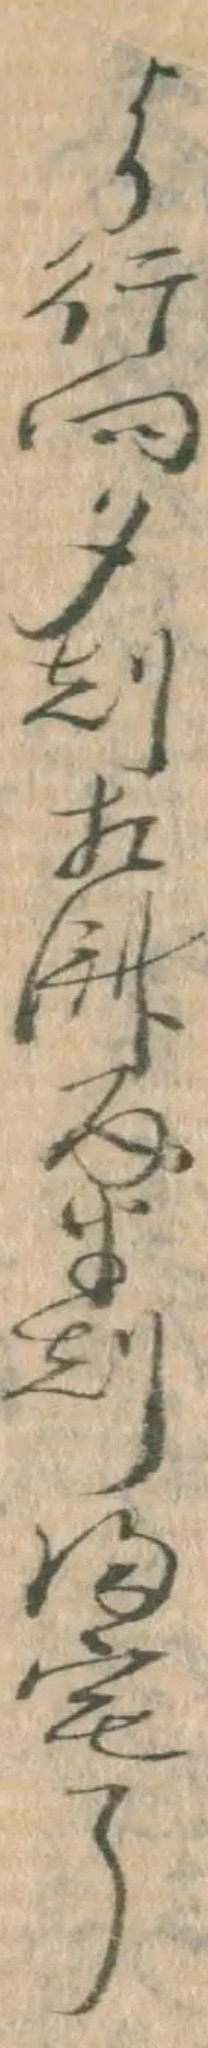より行向夕刻相済酉半刻帰宅了
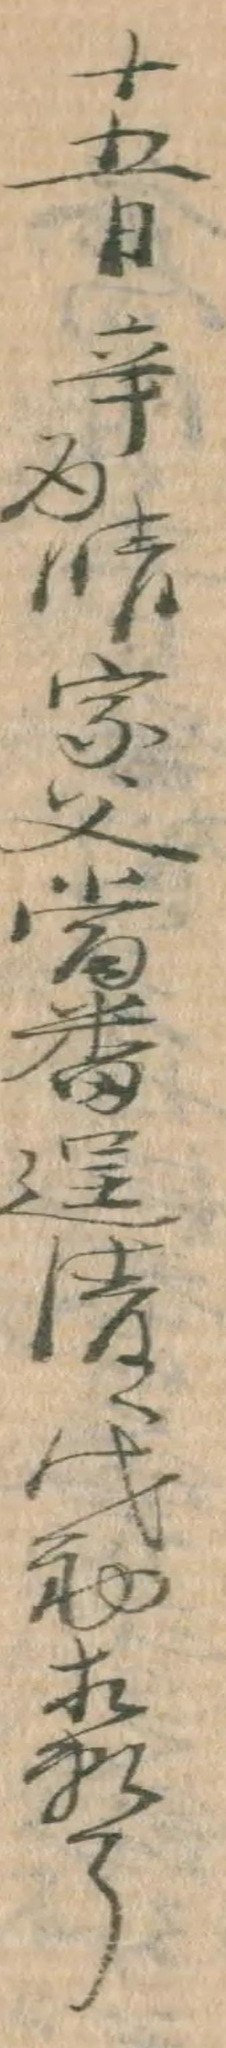十五日辛酉晴家父當番逞清へ代勤相頼了
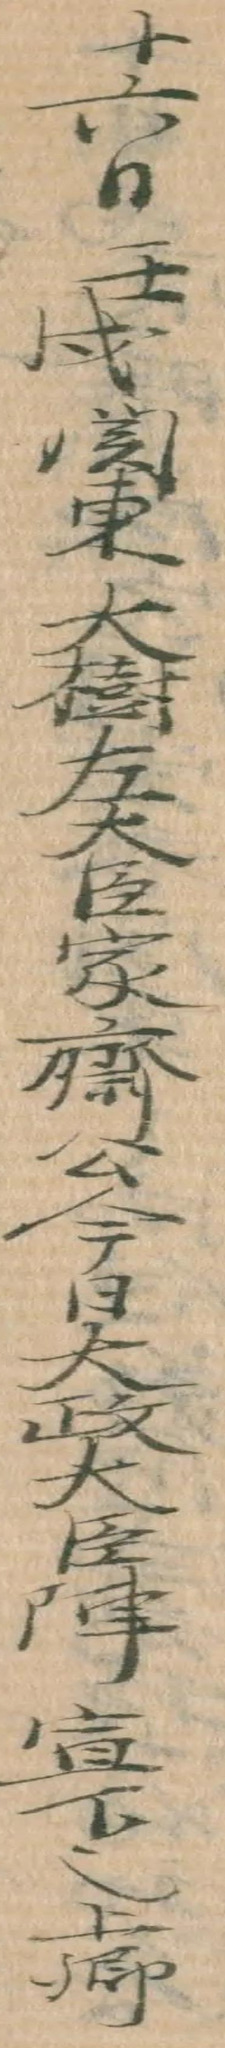十六日壬戌関東大樹左大臣家齋公今日大政大臣陣宣下也上卿
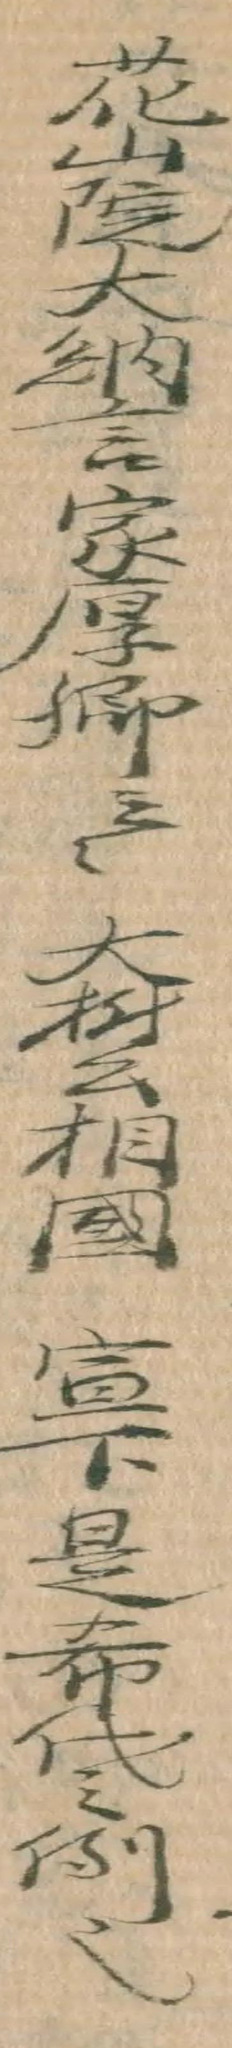花山院大納言家厚卿云々大樹公相國宣下是希代之例也
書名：賀茂社記録. 第65冊
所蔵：国立国会図書館 National Diet Library, JAPAN
